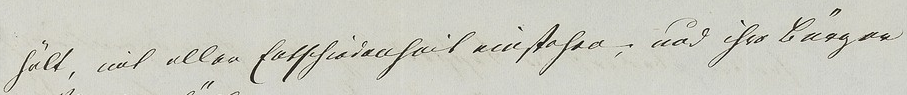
hält, mit aller Entschiedenheit einstehen, und ihre Bürger
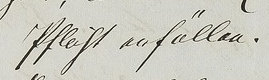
Pflicht erfüllen.
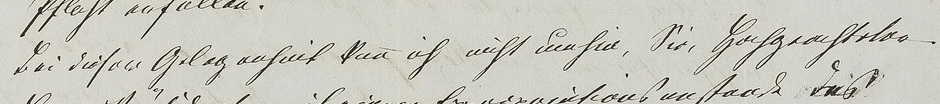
Bei dieser Gelegenheit kann ich nicht umhin, Sie, Hochgeachteter
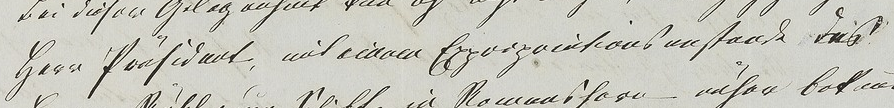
Herr Präsident, mit einem Expropriationsanstande des
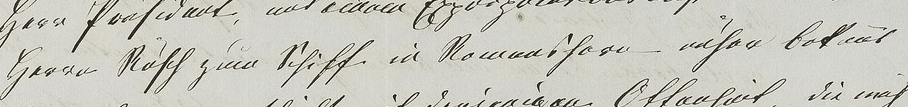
Herrn Rüsch zum Schiff in Romanshorn näher bekannt
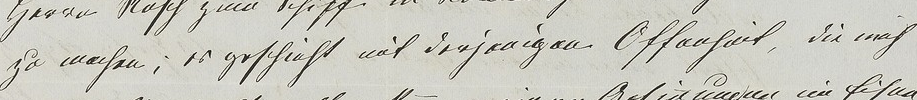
zu machen; es geschieht mit derjenigen Offenheit, die mich
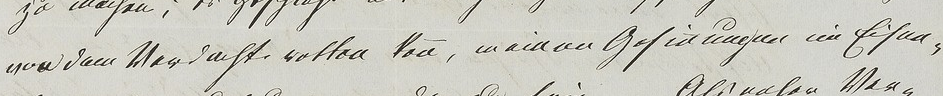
vor dem Verdacht retten kann, meinen Gesinnungen im Eisen-
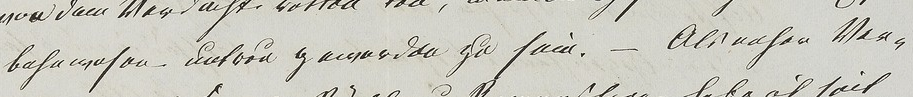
bahnwesen untreu geworden zu sein. – Als naher Ver-
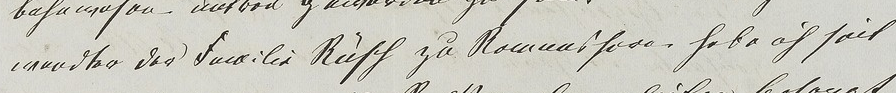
wandter der Familie Rüsch zu Romanshorn habe ich seit
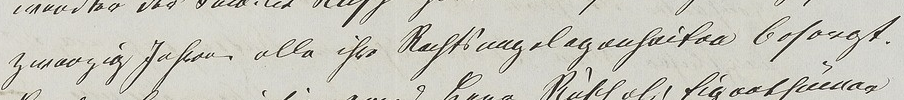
zwanzig Jahren alle ihre Rechtsangelegenheiten besorgt.
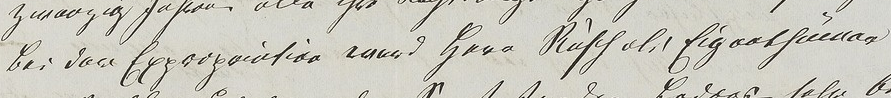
Bei der Expropriation ward Herr Rüsch als Eigenthümer
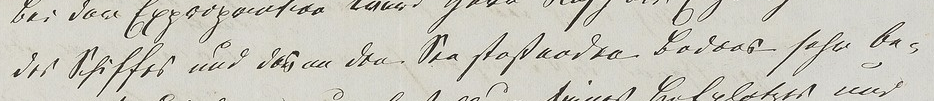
des Schiffes und des an den See stoßenden Bodens sehr be-
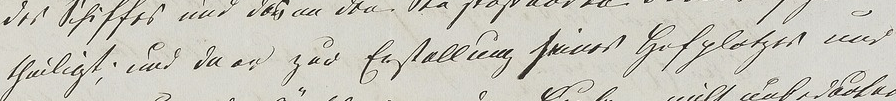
theiligt; und da er zur Erstellung seines Hofplatzes und
